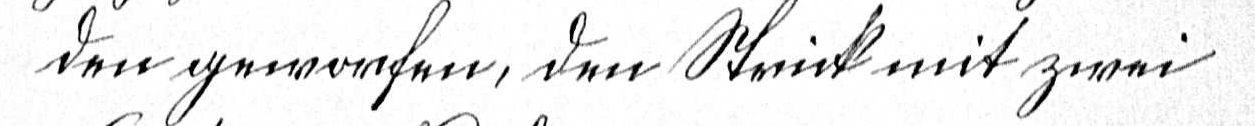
den geworfen, den Strick mit zwei
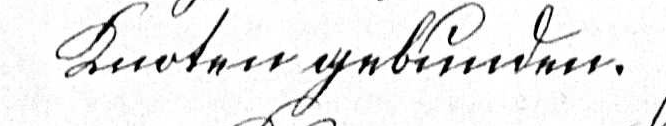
Knoten gebunden.
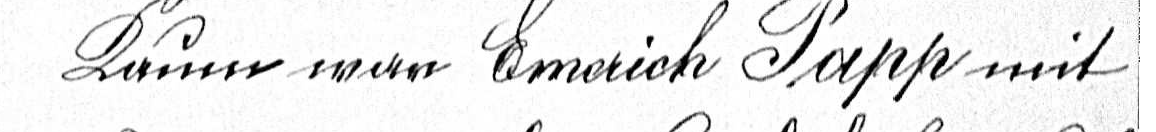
Kaum war Emerich Papp mit
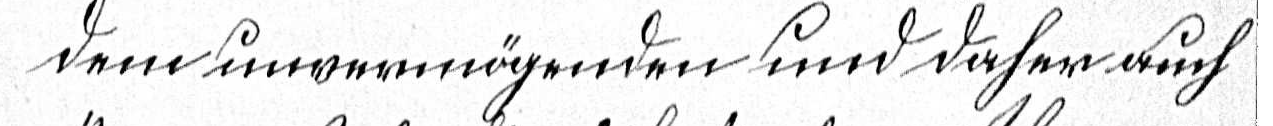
dem u[ ]Uogenden und daher auch
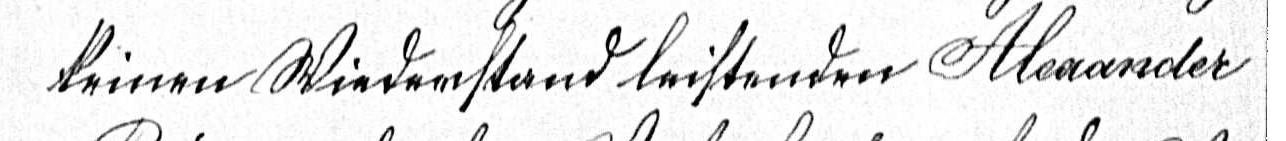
keinen Wiederstand lesitenden Alexander
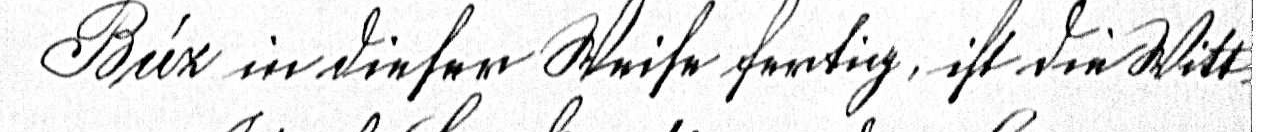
Búz in dieser Weise fertig, ist die Witt¬
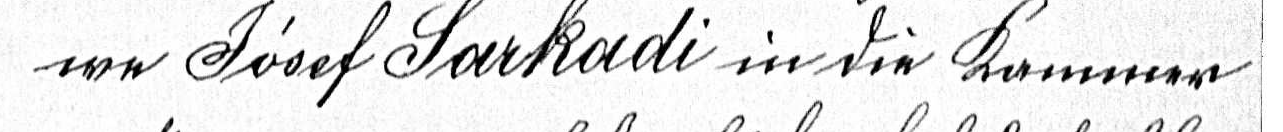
we Jósef Sarkadi in die Kammer
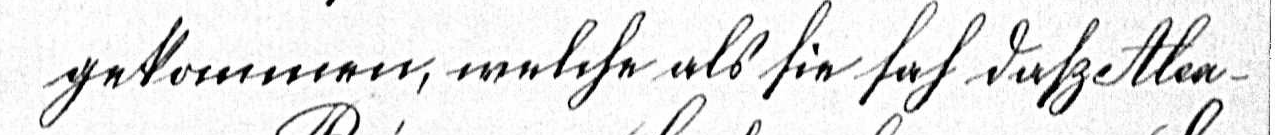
gekommen, welche als sie sah daß Ale¬
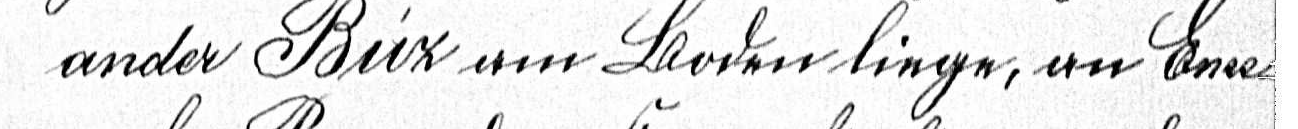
xander Búz am Boden liege, an Eme¬
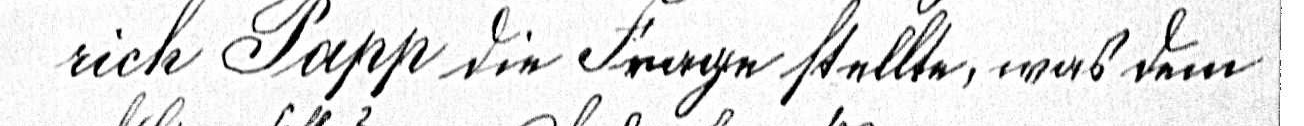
rich Papp die Frage stellte, was dem
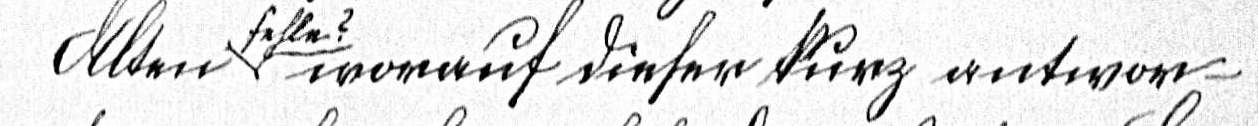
Alten falle? Worauf dieser kurz antwor¬
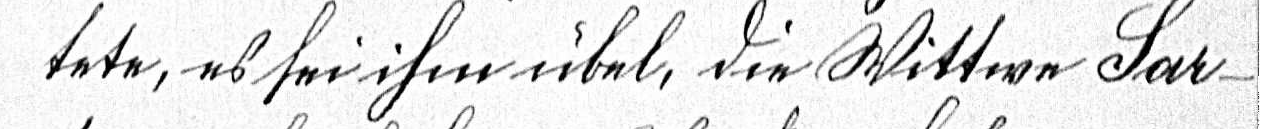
tete, es sei ihm übel, die Wittwe Sar¬
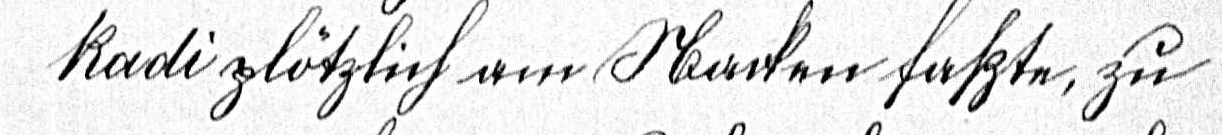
kadi plötzlich am Nacken faßte, zu
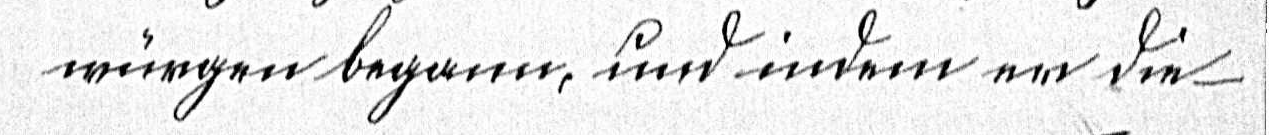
würgen begann, und indem er die¬
